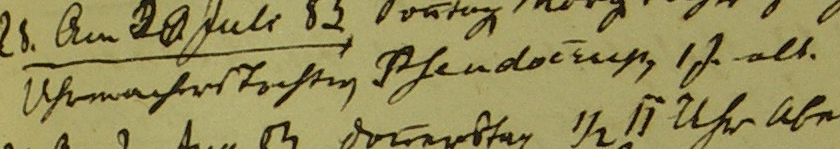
Uhrmachertochter ?Psidorin, 1 J. alt
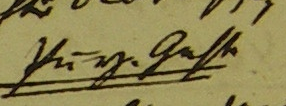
Purzen Gasse
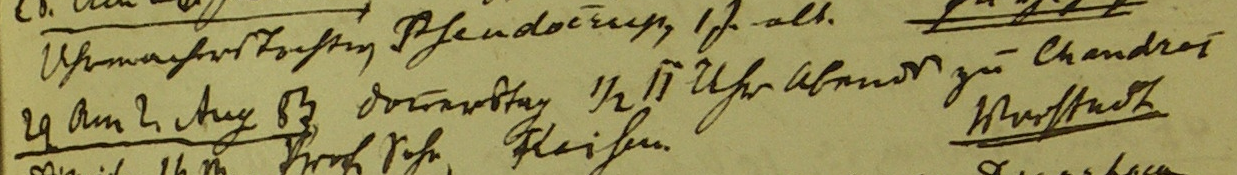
29). Am 2. Aug., 83, Donnerstag, ½ 11 Uhr Abends, zu Chandroi
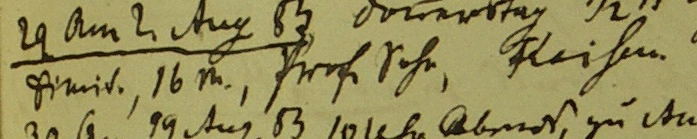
Simit. 16 Mon. Prof. Sohn. ?Kaihen
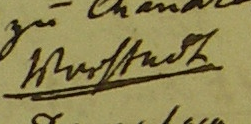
Vorstadt
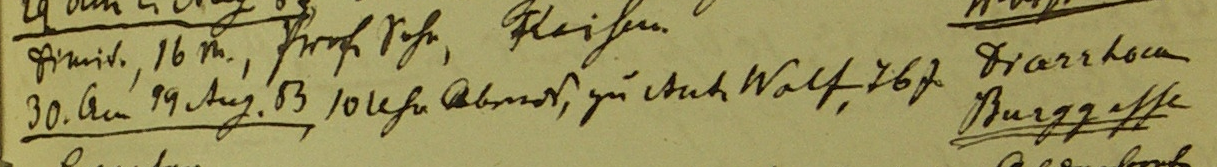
30. Am 11 Aug. 83, 10 Uhr Abends, zu Anti Wolf, 76 J., Diarrhoa
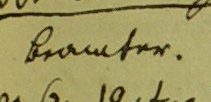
Beamter
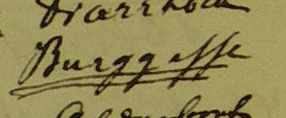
Burggasse
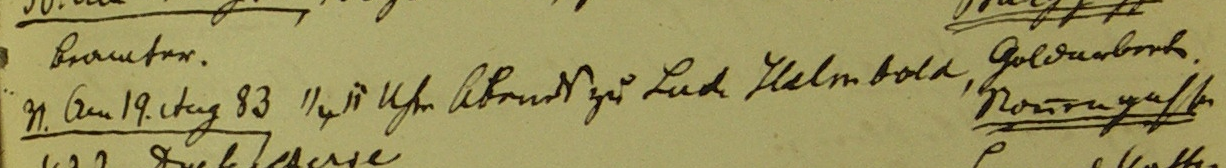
31. Am 19. Aug. 83, ¼ 11 Uhr Abends, zu Lud. Helmhold, Goldarbeiter,
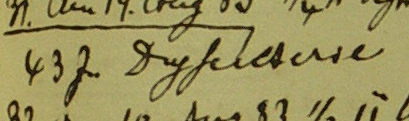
43 J. Dyfenterie
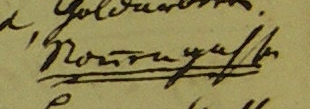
Nonnengasse
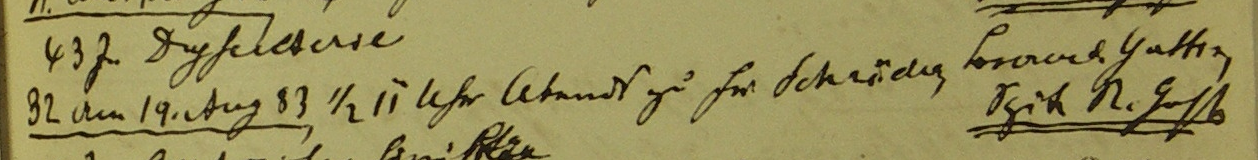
32. Am 19. Aug. 83, 1/2 11 Uhr, Abends, zu Fr. Schröder, Beamt. Gattin,
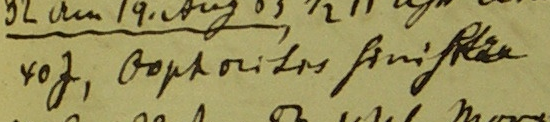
40 J., Optorites sinis?stän
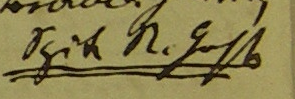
Spit. Ring
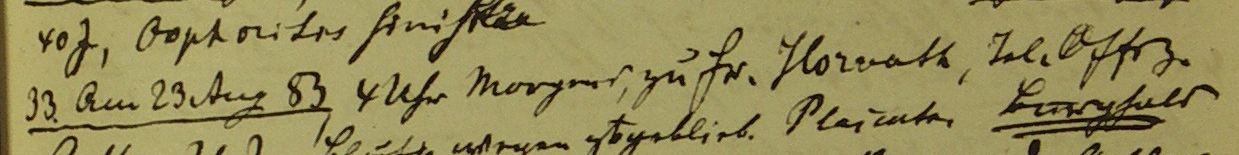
33. Am 23. Aug. 83 4 Uhr Morgens, zu Fr. Horvath, Tal. Offiz.
